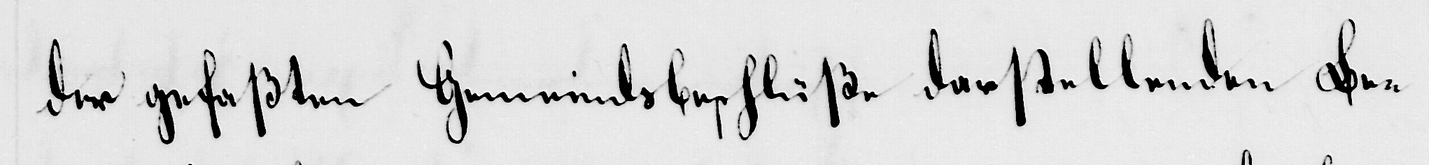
der gefaßten Gemeindsbeschlüße darstellenden Be¬
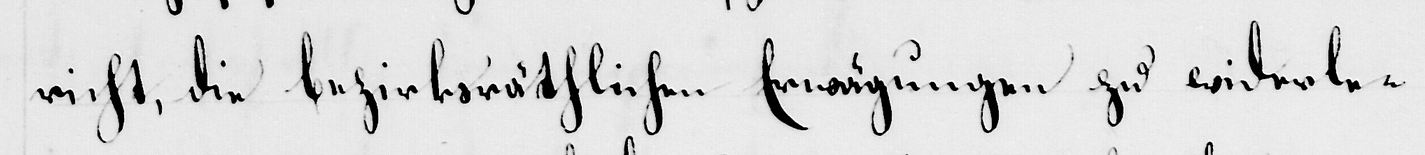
richt, die bezirksräthlichen Erwägungen zu widerle¬
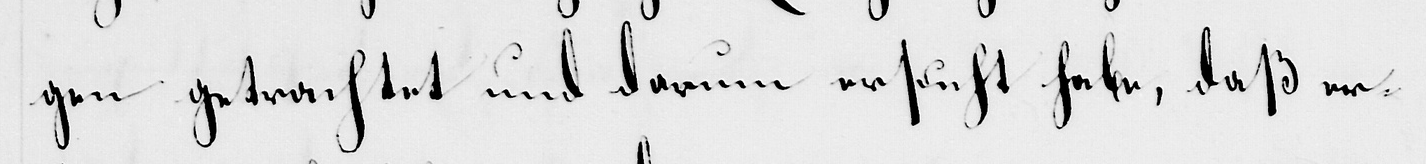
gen getrachtet und darum ersucht habe, daß er¬
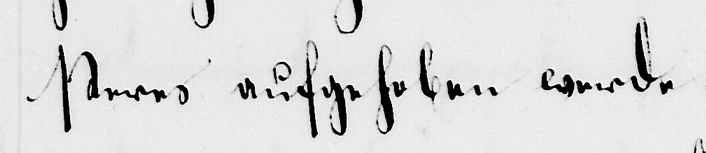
steres aufgehoben werde.
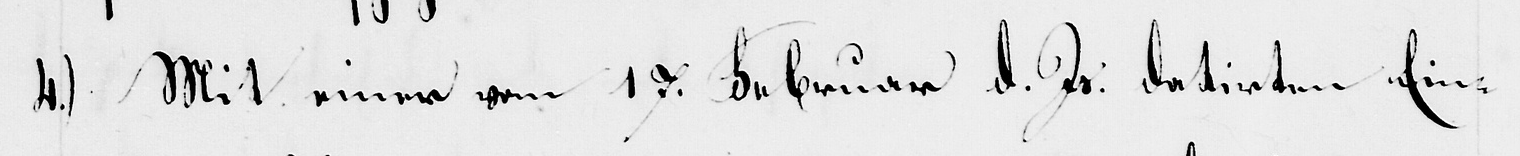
4.) Mit einer vom 17. Februar d. Js. datirten Ein¬
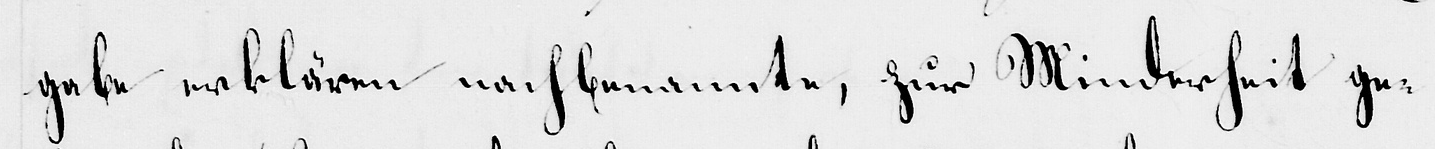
gabe erklären nachbenannte, zur Minderheit ge¬
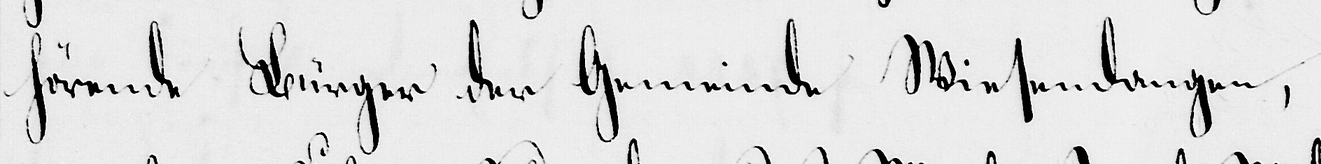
hörende Bürger der Gemeinde Wiesendangen,
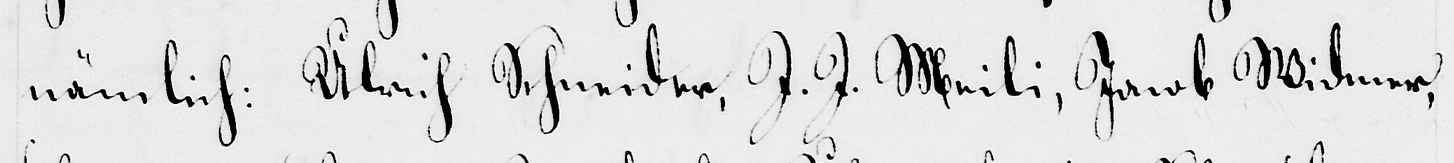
nämlich: Ulrich Schreiber, J. J. Meili, Jacob Widmer,
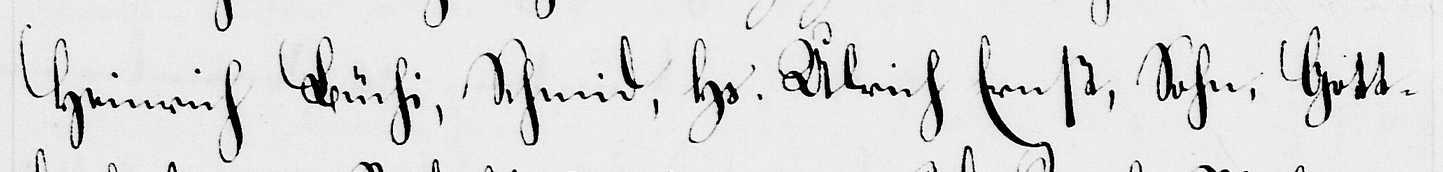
Heinrich Büchi, Schmid, Hs. Ulrich Ernst, Sohn, Gott¬
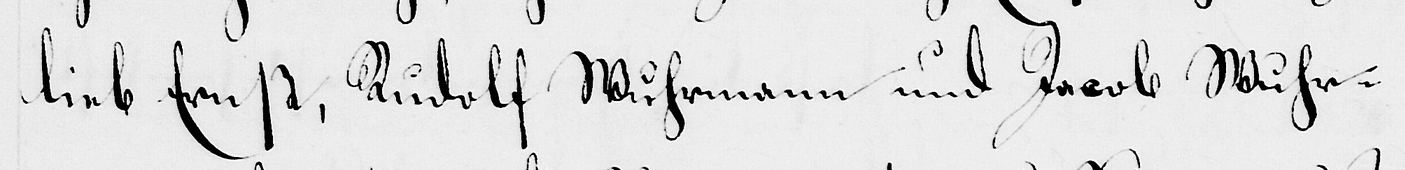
lieb Ernst, Rudolf Wuhrmann und Jacob Wuhr¬
